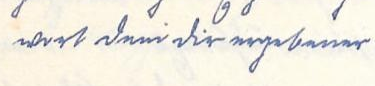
wort dein Dir ergebener
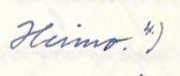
Heimo- 4)
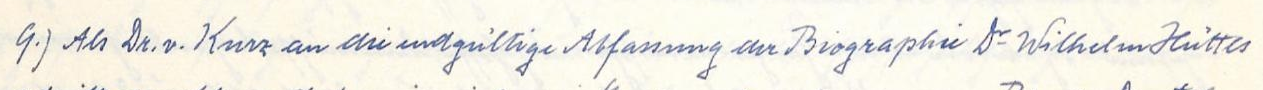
9) Als Dr. v. Kurz an die endgültige Abfassung der Biographie D. Wilhelm Hüttls
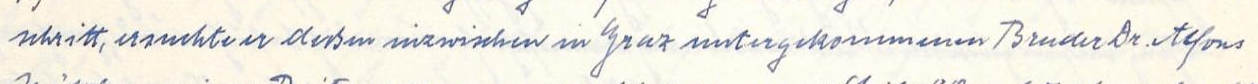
schritt, ersuchte er dessen inzwischen in Graz untergekomenen Bruder Dr Alfons
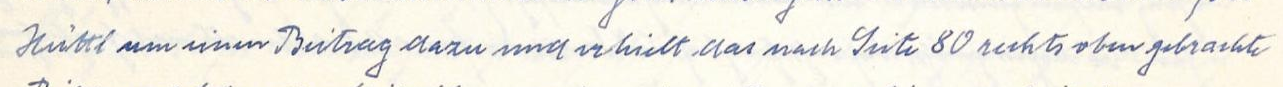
Hüttl um einen Beitrag dazu und erhielt das nach Seite 8 rechts oben gebrachte
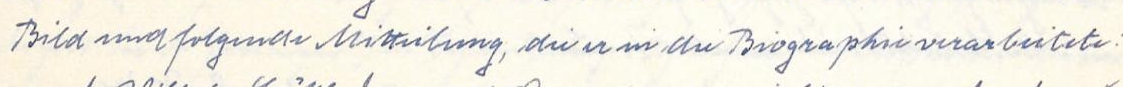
Bild und folgende Mitteilung, die er in die Biographie verarbeitete:
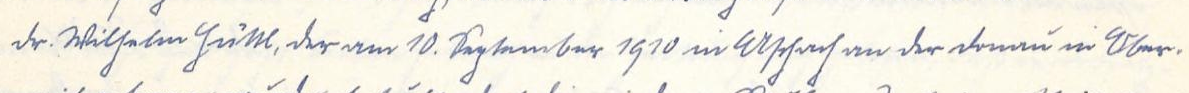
Dr. Wilhelm Hüttl, der am 10. September 1910 in Aschach an der Donau in Ober-
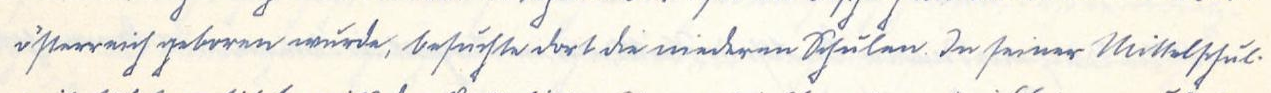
österreich geboren wurde, besuchte dort die niederen Schulen. In seiner Mittelschul-
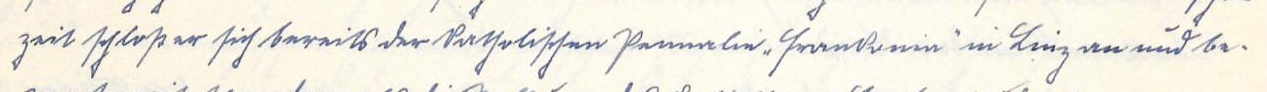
zeit schloß er sich bereits der katholischen Pennalie „Frankonia" in Linz an und be-
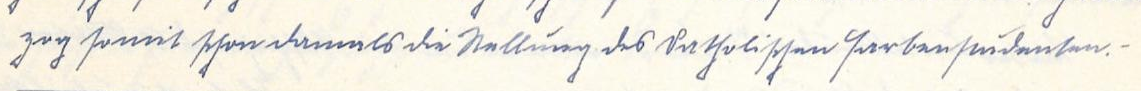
zog somit schon damals die Stellung des katholischen Farbenstudenten. -
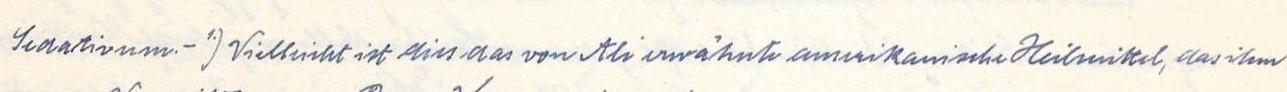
Sedativum.–2) Vielleicht ist dies das von Ali erwähnte amerikanische Heilmittel, das ihm
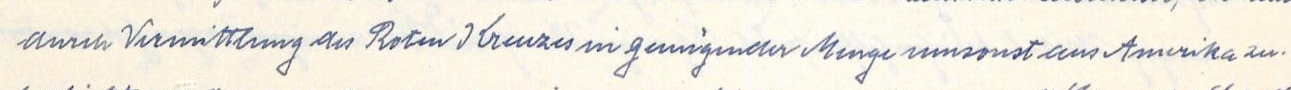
durch Vermittung des Roten Kreuzes in genügender Menge umsonst aus Amerika zu-
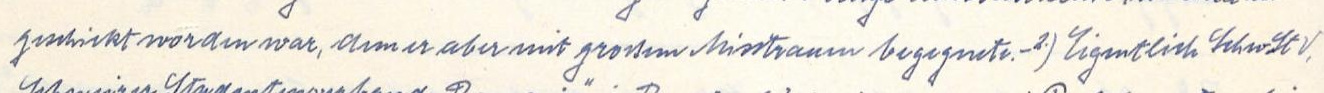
geschickt worden war, dem er aber mit großen Misstraum begegnete. ) Eintlich SchwStV
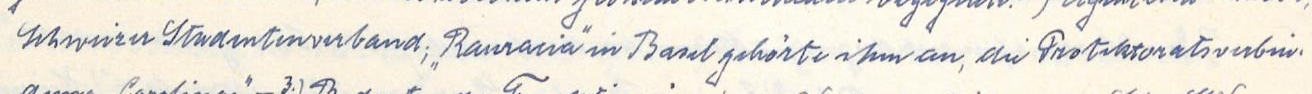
Schweizer Studentenverband, Rauracia in Basel gehörte ihm an, die Protekteoratsverbin-
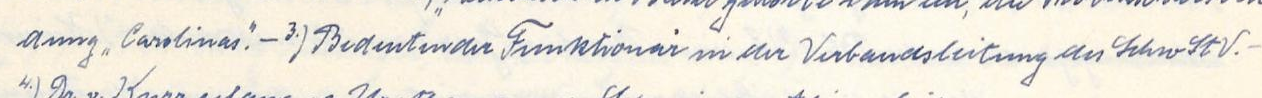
dung "Carolinas“.- 3) Bedentender Funktionär in der Verbandsleitung des SchwStV.
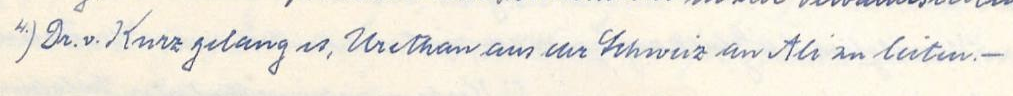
2) Dr. v. Kurz gelang es, Urethan aus der Schweiz an Ali zu leiten.
